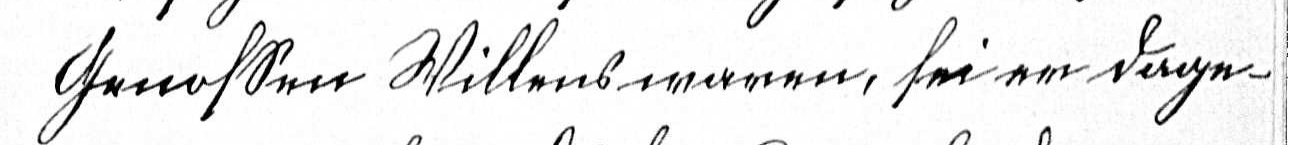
Genossen Willens waren, sei er dage¬
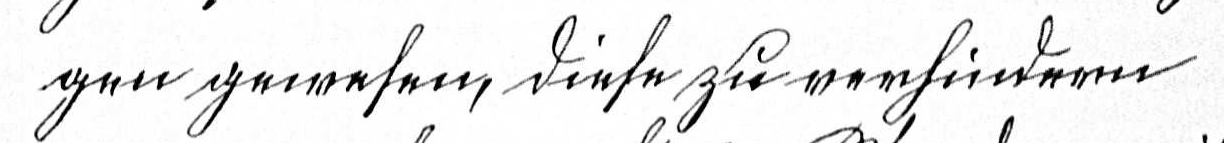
gen gewesen, diese zu verhindern
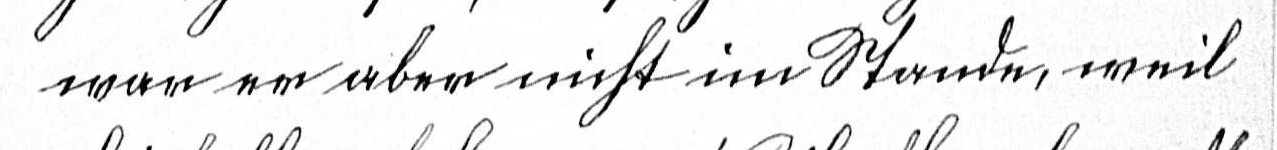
war er aber nicht im Stande, weil
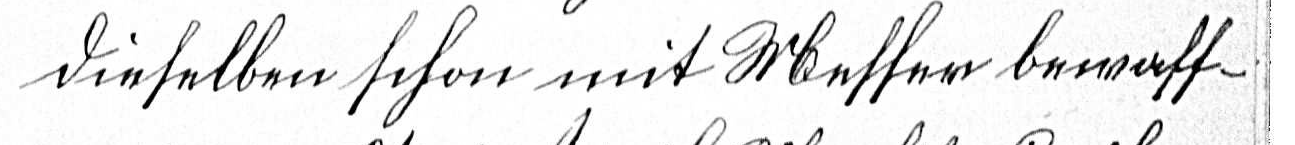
dieselben schon mit Messer bewaff¬
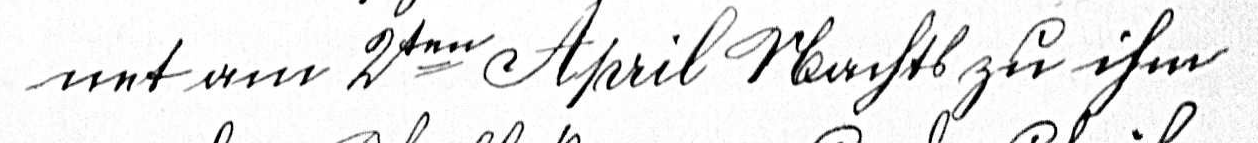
net am 2ten April Nachts zu ihm
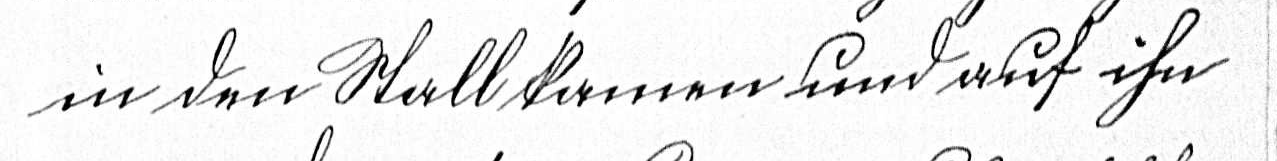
in den Stall kamen und auf ihn
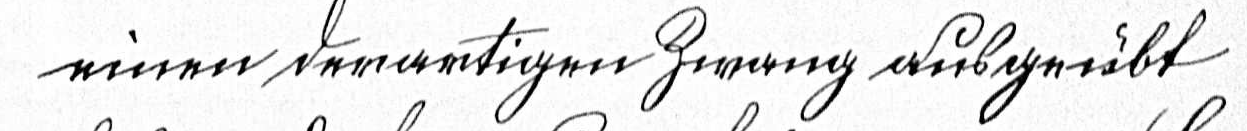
einen derartigen Zwang augeübt
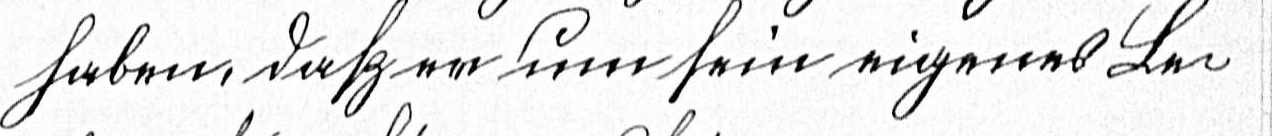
haben, daß er um sein eigens Le¬
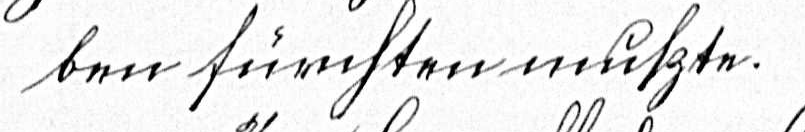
ben fürchten mußte.
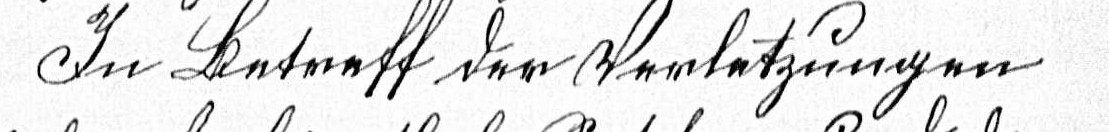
In Betreff der Verletzungen
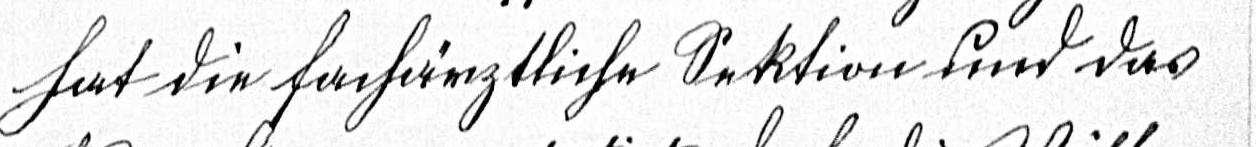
hat die fachärztliche Sektion und das
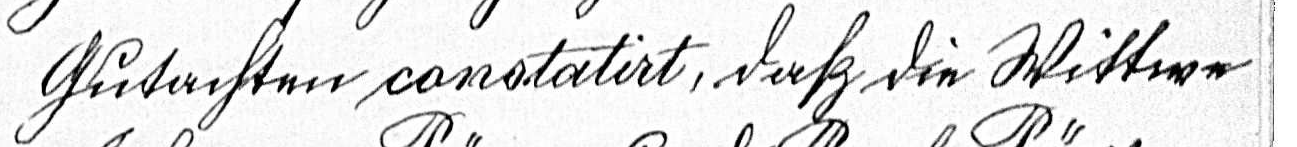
Gutachten constatirt, daß die Wittwe
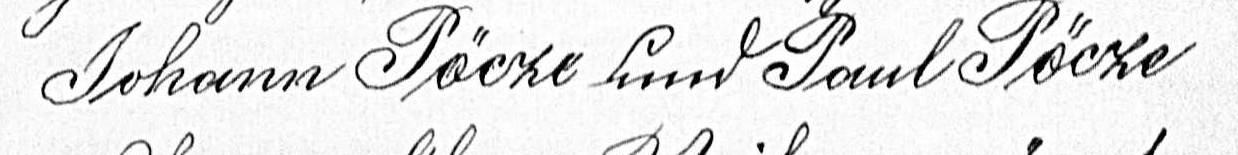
Johann Pöcze und Paul Pöcze
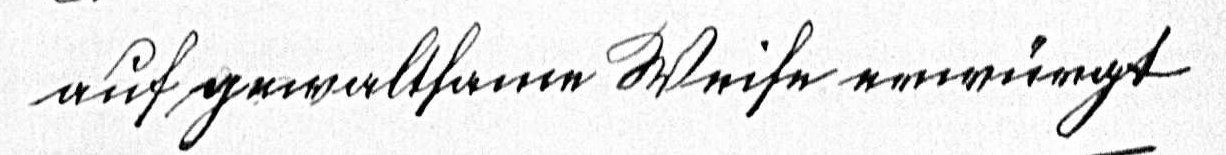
auf gewaltsame Weise erwürgt
